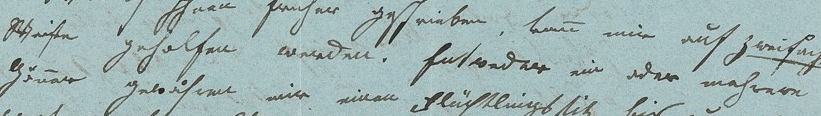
Weise geholfen werden. Entweder ein oder mehrere
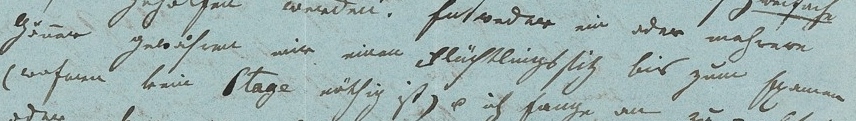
Gönner gewähren mir einen Flüchtlingssiz bis zum Examen
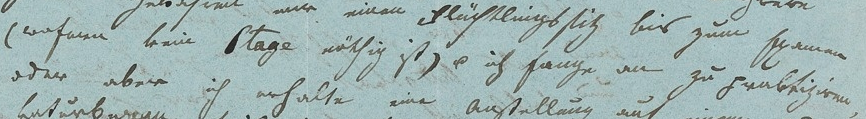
(wofern kein Stage nöthig ist) & ich fange an zu praktiziren,
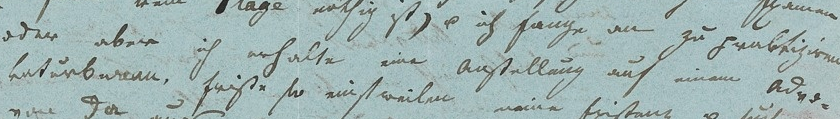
oder aber ich erhalte eine Anstellung auf einem Advo-
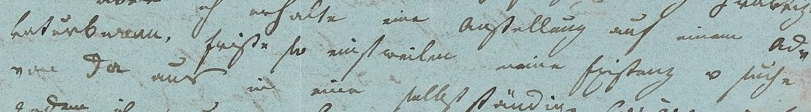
katurbureau, friste so einstweilen meine Existenz & suche
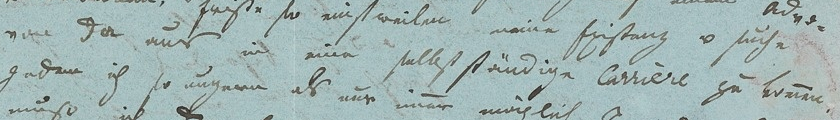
von da aus in eine selbstständige Carrière zu kommen.
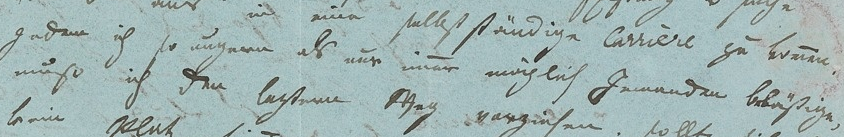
Indem ich so ungern als nur immer möglich Jemanden belästige,
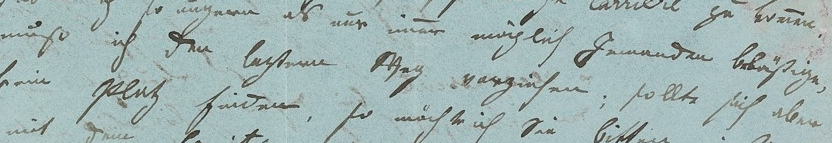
muß ich den leztern Weg vorziehen; sollte sich aber
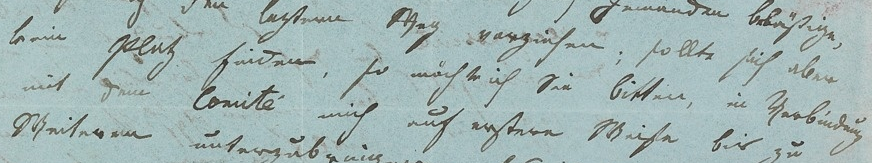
kein Platz finden, so möchte ich Sie bitten, in Verbindung
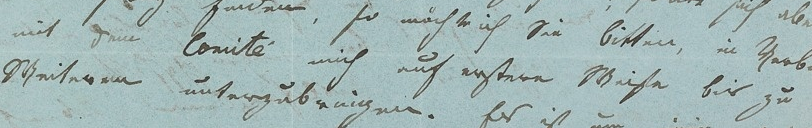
mit dem Comité mich auf erstere Weise bis zu
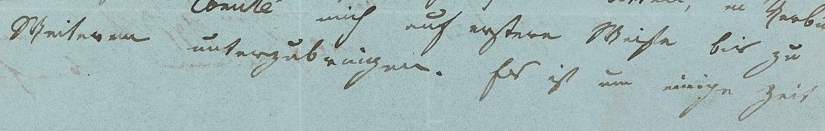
Weiterem unterzubringen. Es ist um einige Zeit
